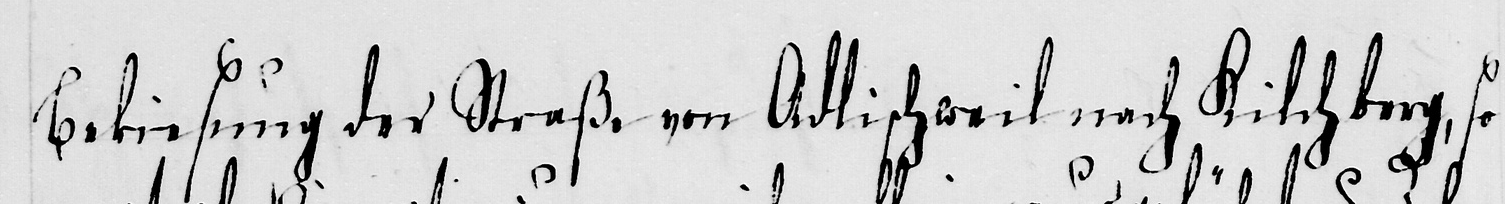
Bekiesung der Straße von Adlischweil nach Kilchberg,
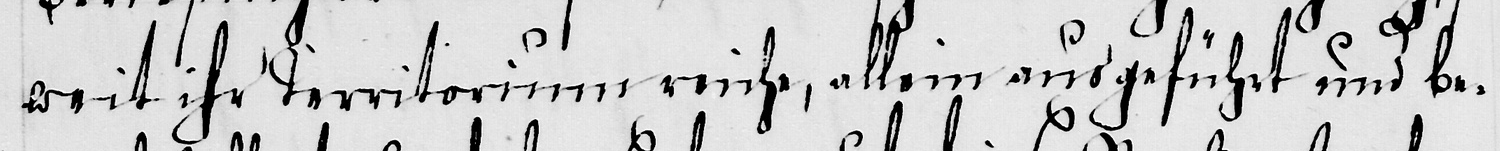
weit ihr Territorium reiche, allein ausgeführt und be¬
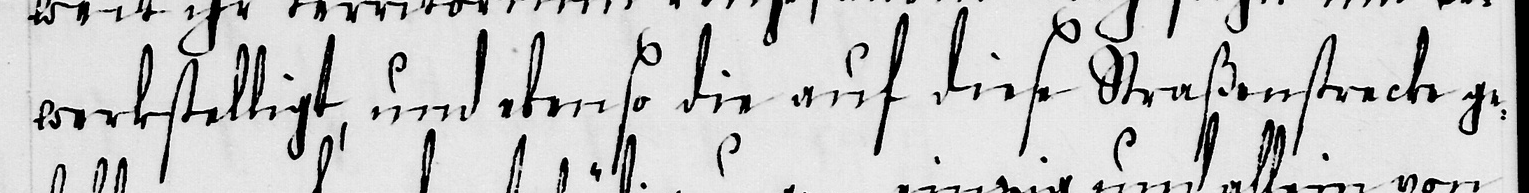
werkstelligt, und ebenso die auf diese Straßenstrecke g¬
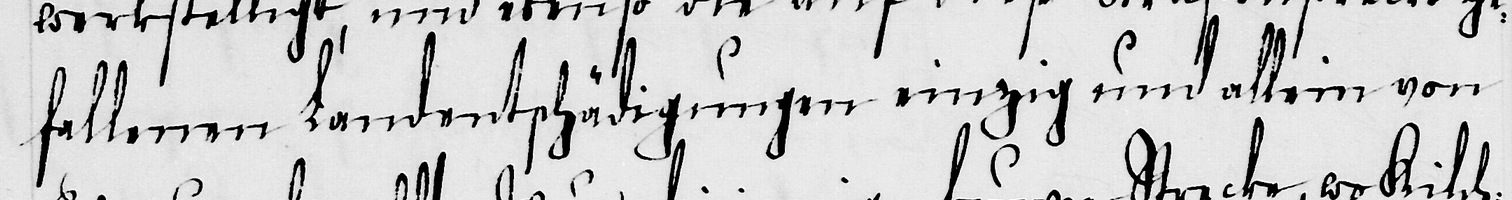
efallenen Landentschädigungen einzig und allein von
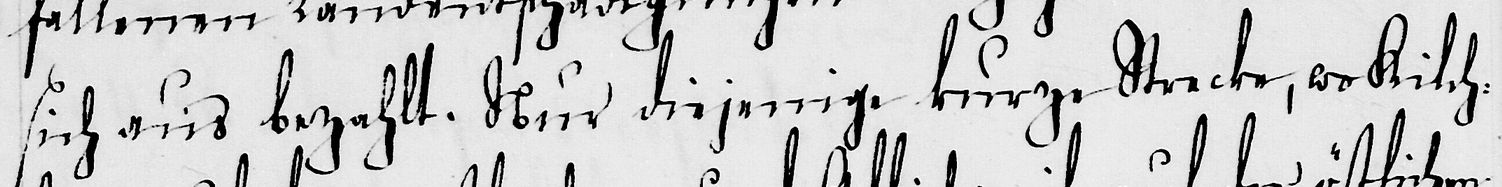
sich aus bezahlt. Nur diejenige kurze Strecke, wo Kilch¬
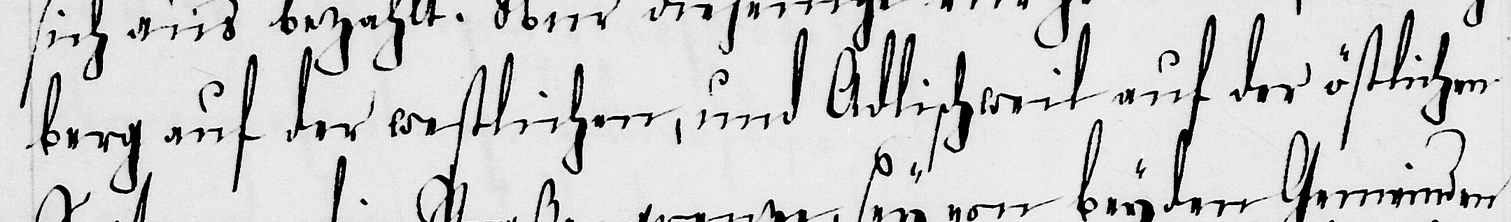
berg auf der westlichen, und Adlischweil auf der östlich¬
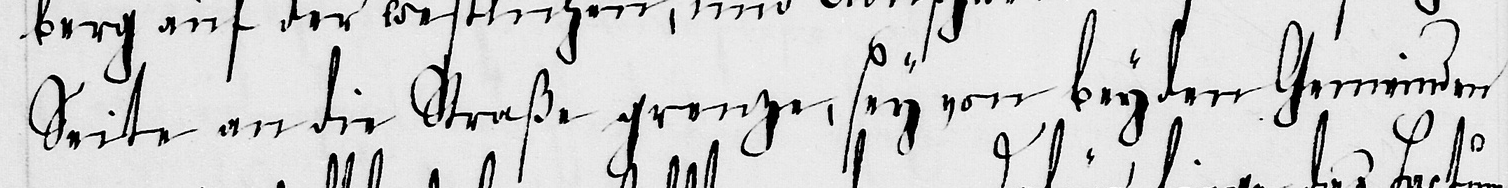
Seite an die Straße grenze, sey von beyden Gemeinden
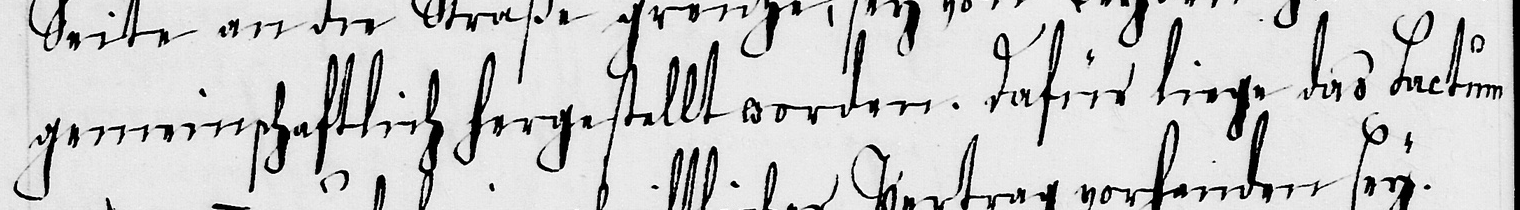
gemeinschaftlich hergestellt worden. Dafür liege das Factum
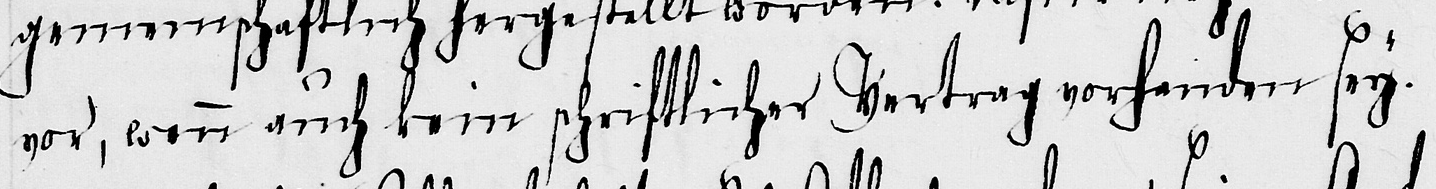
vor, wenn auch kein schriftlicher Vertrag vorhanden sey.
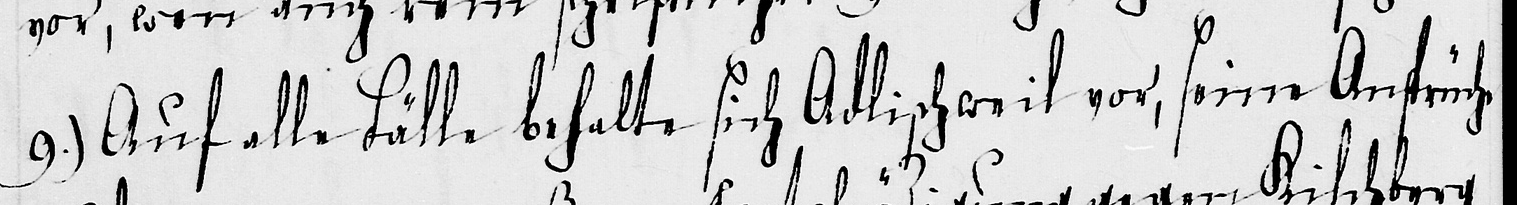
9.) Auf alle Fälle behalte sich Adlischweil vor, seine Ansprüc¬
